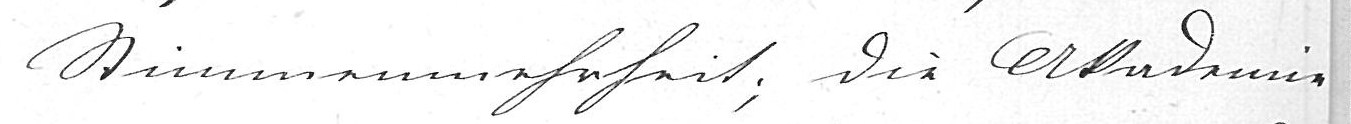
Stimmenmehrheit; die Akademie
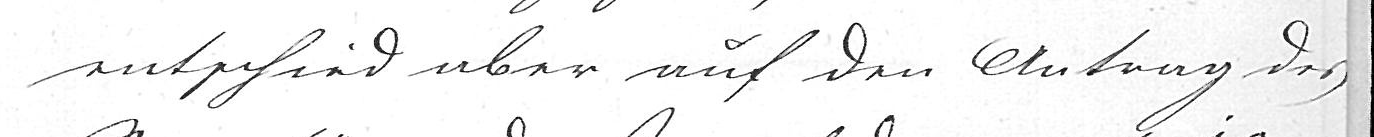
entschied aber auf den Antrag des
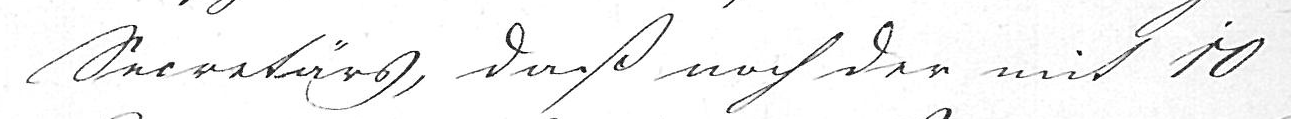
Secretärs, daß noch der mit 10
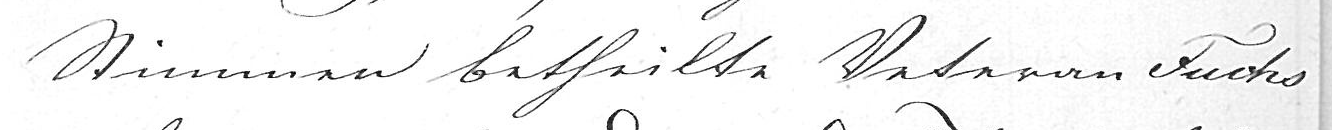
Stimmen betheilte Veteran Fuchs
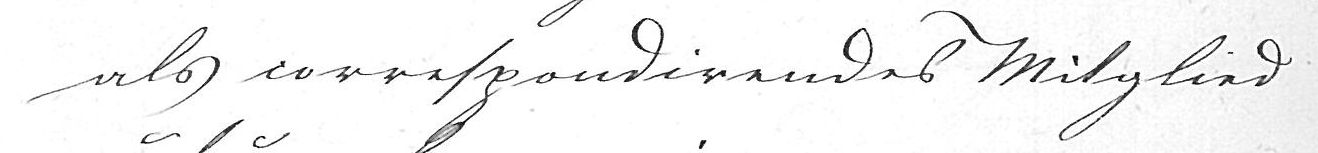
als correspondirende Mitglied
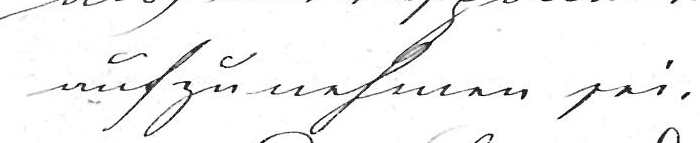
aufzunehmen sei.
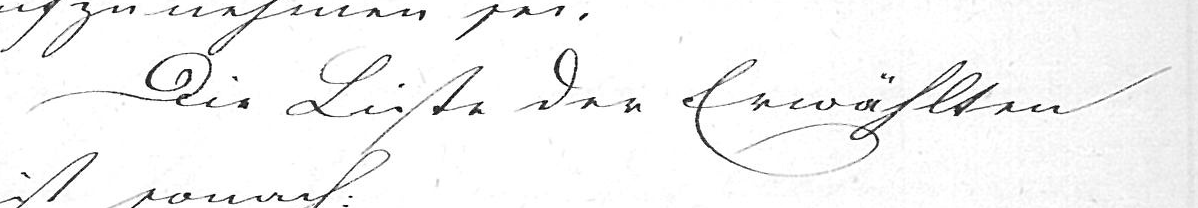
Die Liste der Gewählten
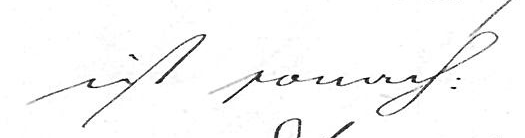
ist sonach:
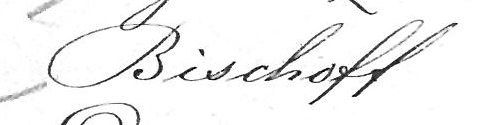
Agassiz
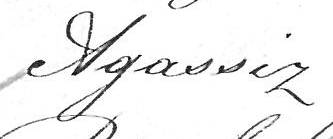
Bischoff
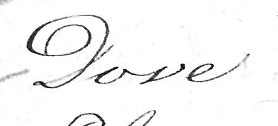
Dove
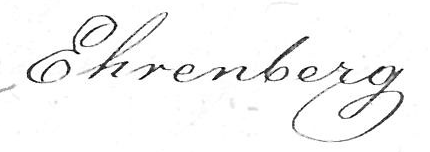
Ehrenberg
